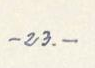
23
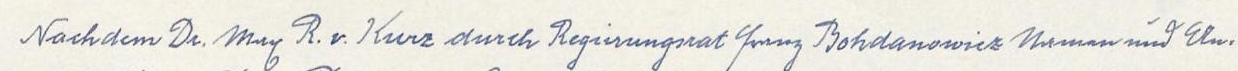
Nachdem Dr. Max R. von Kurz durch Regierungsrat Franz Bohdanowicz Namen und An-
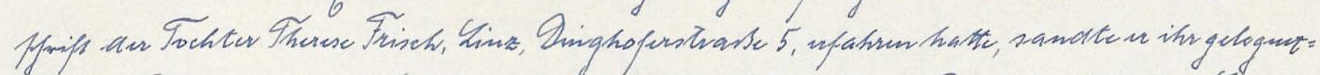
schrift der Tochter Therese Frisch, Linz, Dinghoferstraße 5, erfahren hatte, sandte er ihr gelegent-
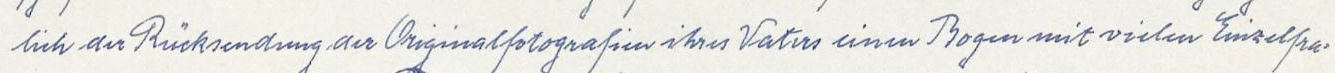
lich der Rücksendung der Originalfotografieren ihres Vaters einen Bogen mit vielen Einzelfra-
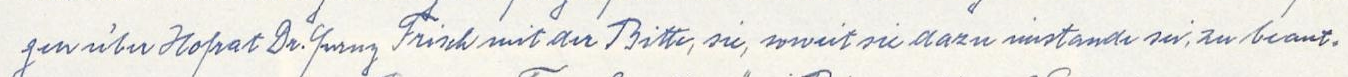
gen über Hofrat Dr. Franz Frisch mit der Bitte, sie, soweit sie dazu imstande sei zu beant-
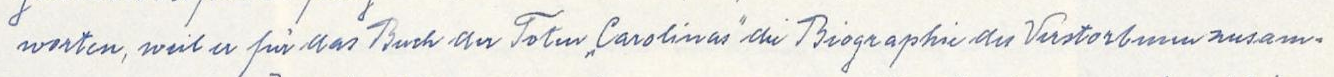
worten, weil er für das Buch der Toten „Carolinas“ die Biographie des Verstorbenen zusam
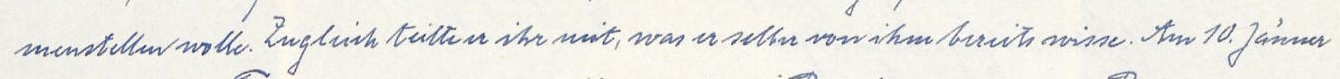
menstellen wolle. Zugleich teilte er mit, was er selber von ihm bereits wiesse. Am 10. Jänner
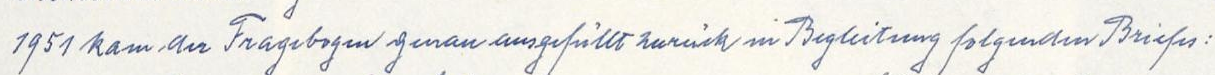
1951 kam der Fragebogen genau ausgefüllt zurück in Begleitung folgenden Briefes:
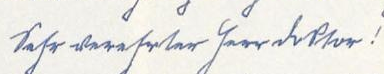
Sehr verehrter Herr Doktor!
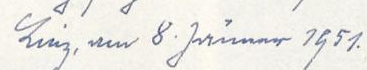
Linz, am 8. Jänner 1951.
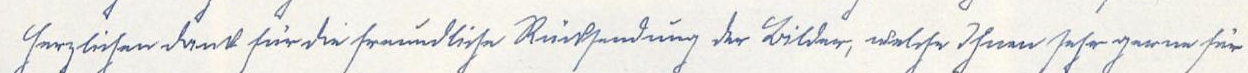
Herzlichen Dank für die freundliche Rücksendung der Bilder, welche Ihnen sehr gerne für
